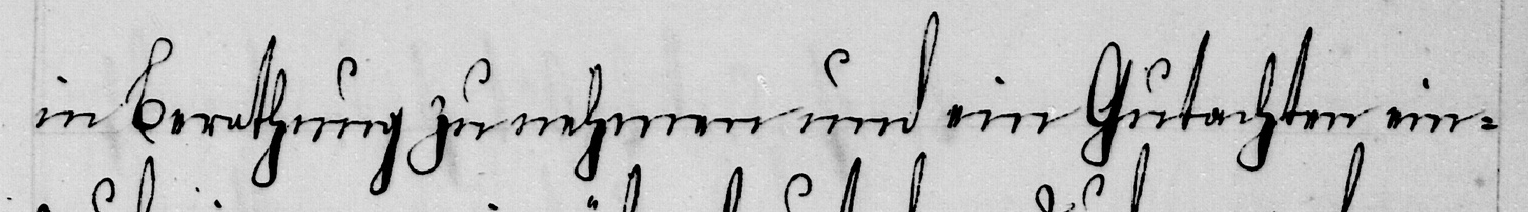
in Berathung zu nehmen und ein Gutachten ein¬
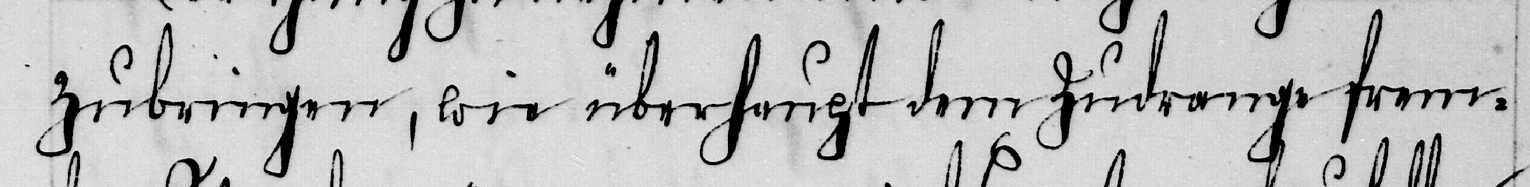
zubringen, wie überhaupt dem Zudrange frem¬
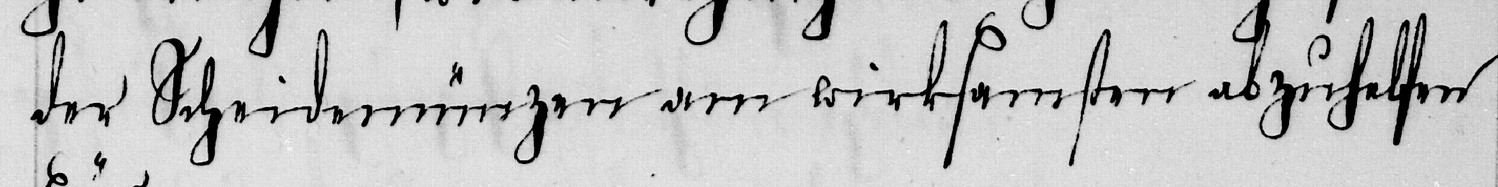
der Scheidemünzen am wirksamsten abzuhelfen
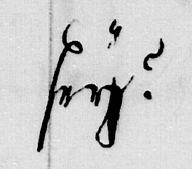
sey?
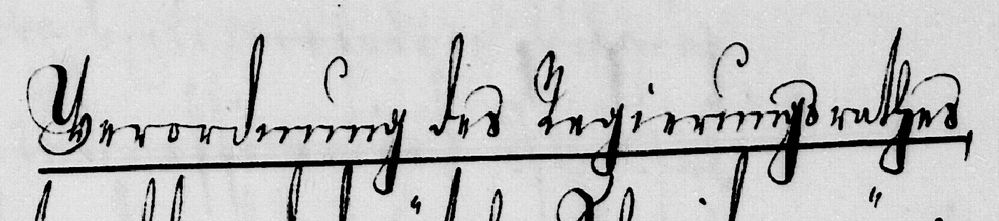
Verordnung des Regierungsrathes,
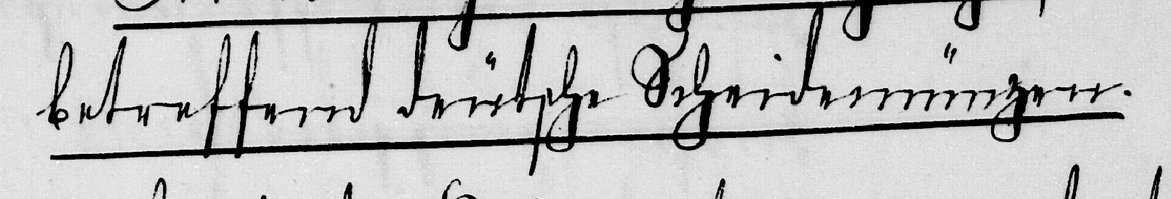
betreffend deutsche Scheidemünzen.
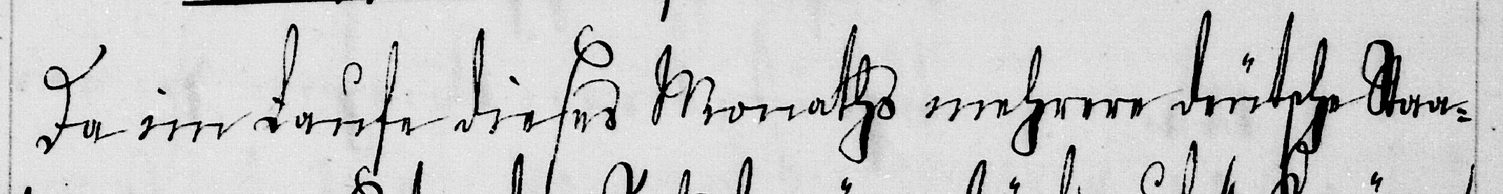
Da im Laufe dieses Monaths mehrere deutsche Sta¬
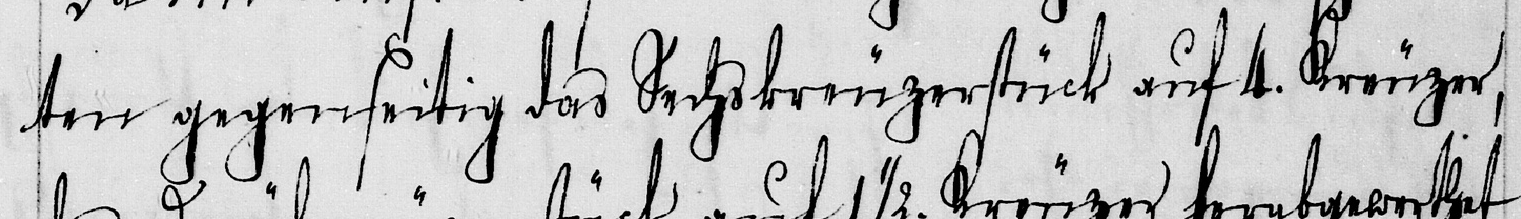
aten gegenseitig das Sechskreuzerstück auf 4. Kreuzer,
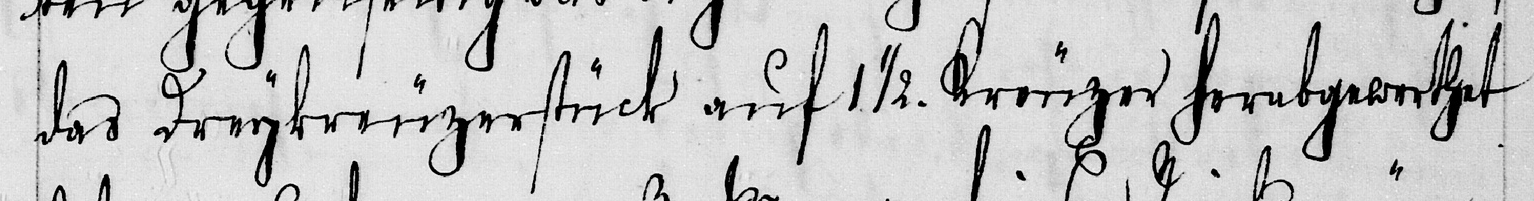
das Dreykreuzerstück auf 1 1/2. Kreuzer herabgewerthet
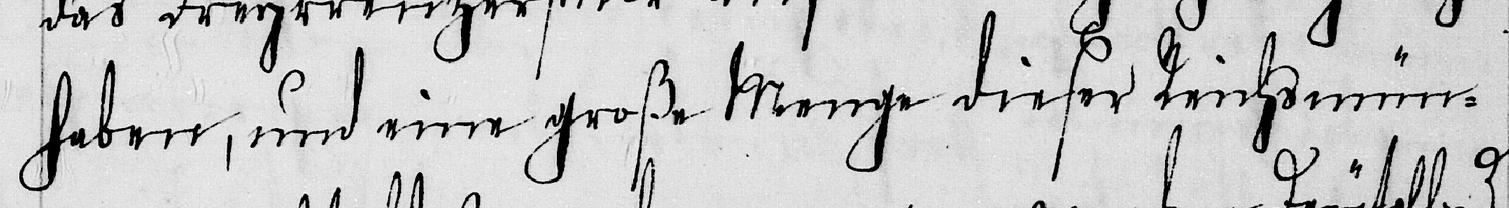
haben, und eine große Menge dieser Reichsmün¬
